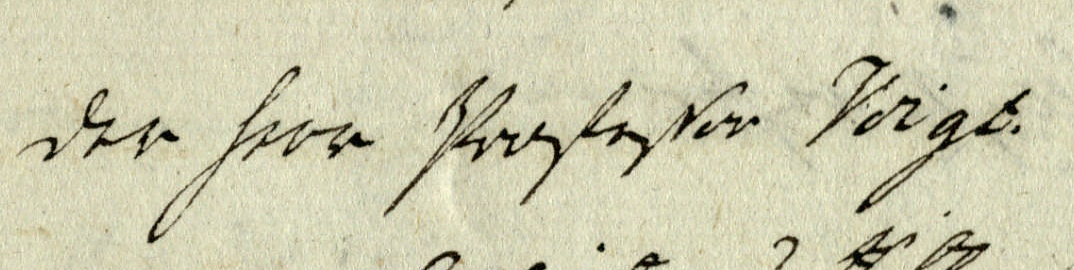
der Herr Professor Voigt.
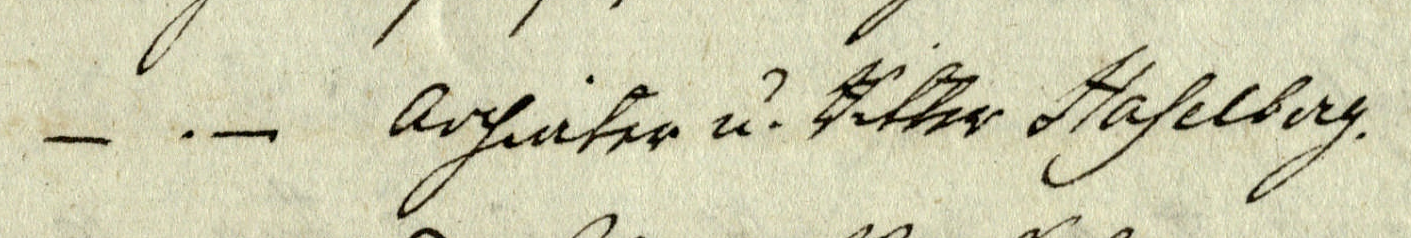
Archiater u. Ritter Haselberg.
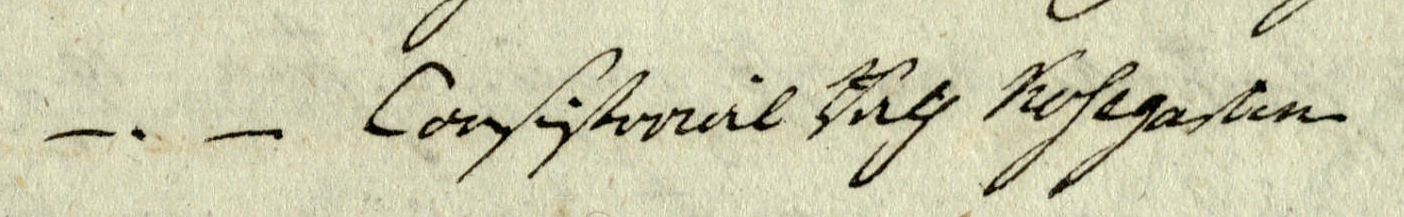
Consistorial Rath Kosegarten
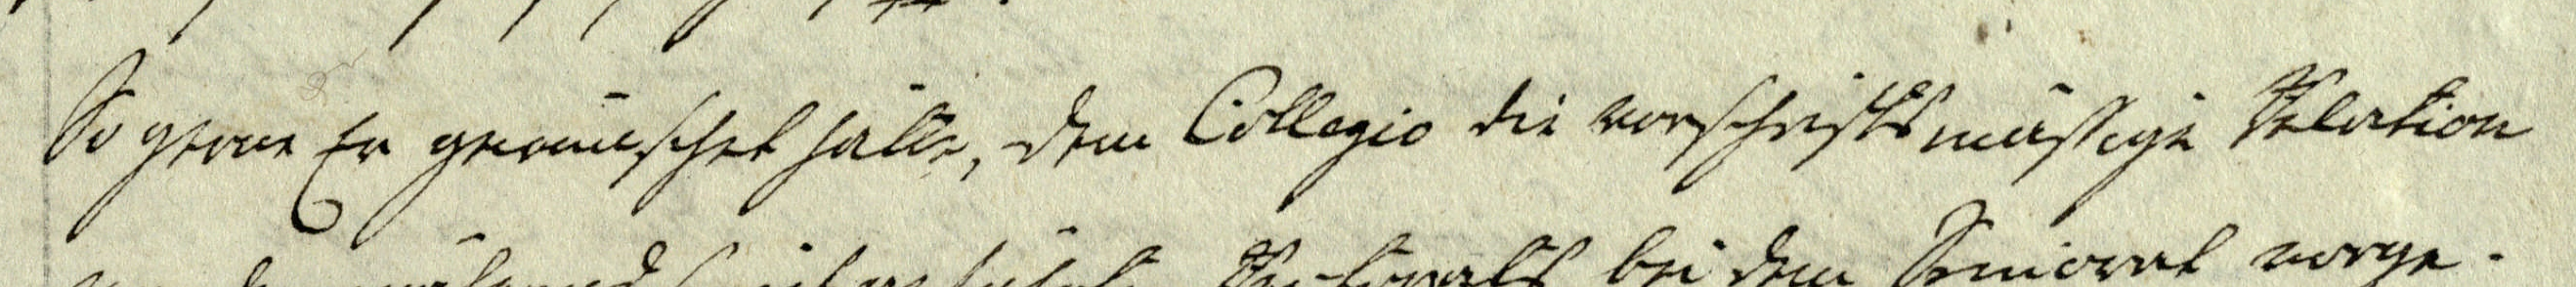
So gerne Er gewünschet hätte, dem Collegio die vorschriftsmäßige Relation
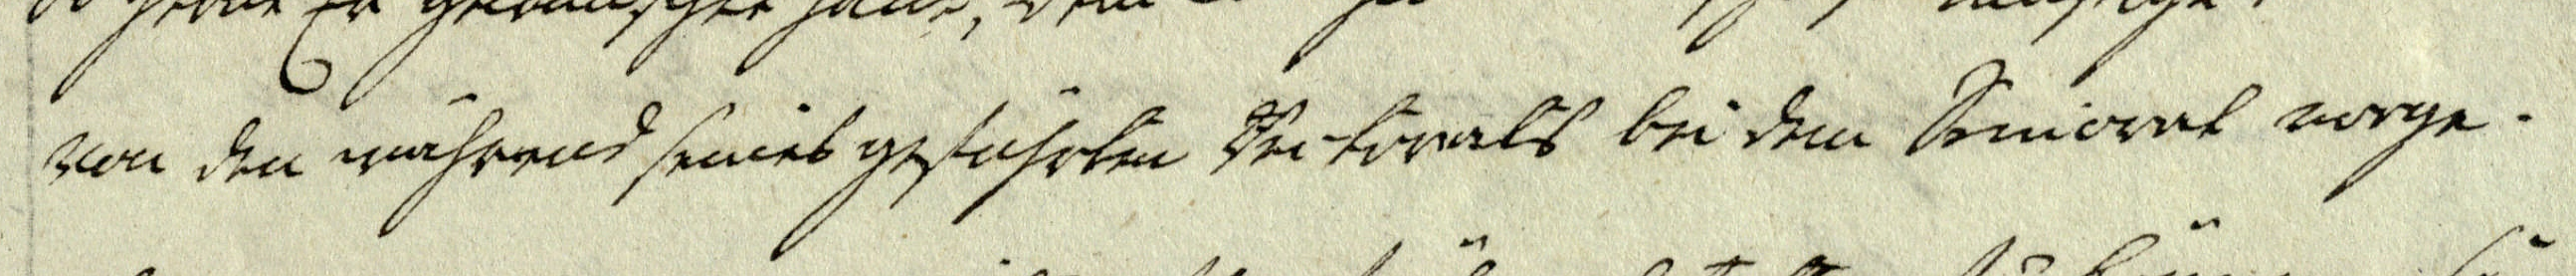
von den während seines geführten Rectorats bei dem Seniorat vorge¬
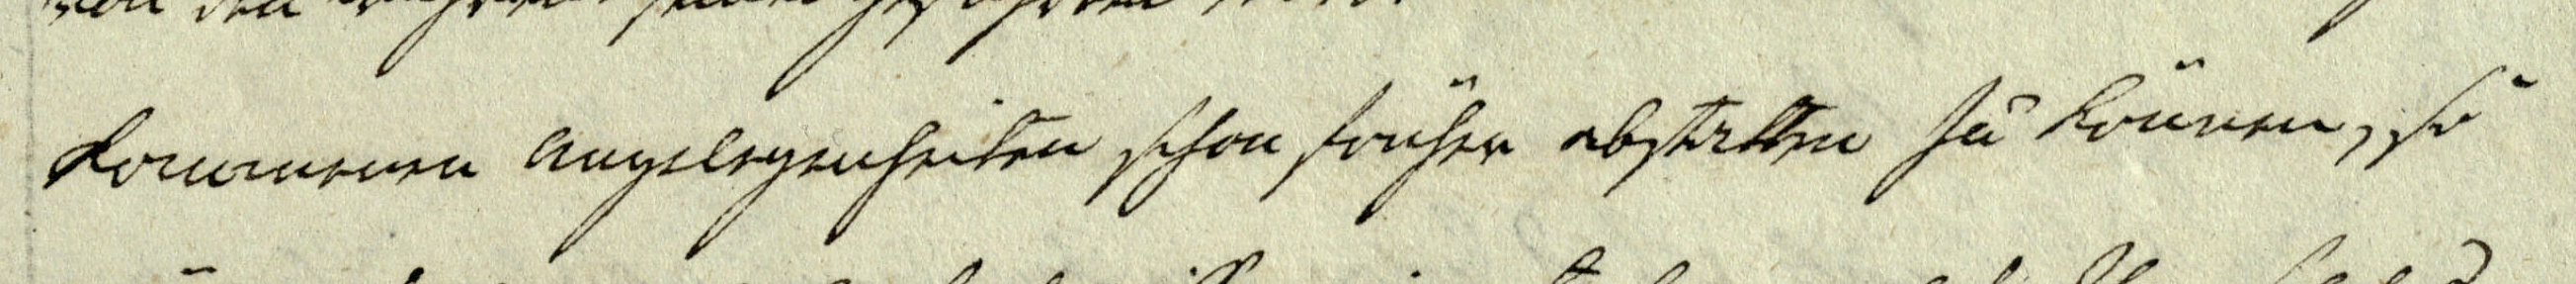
kommenen Angelegenheiten schon früher abstatten zu können, so
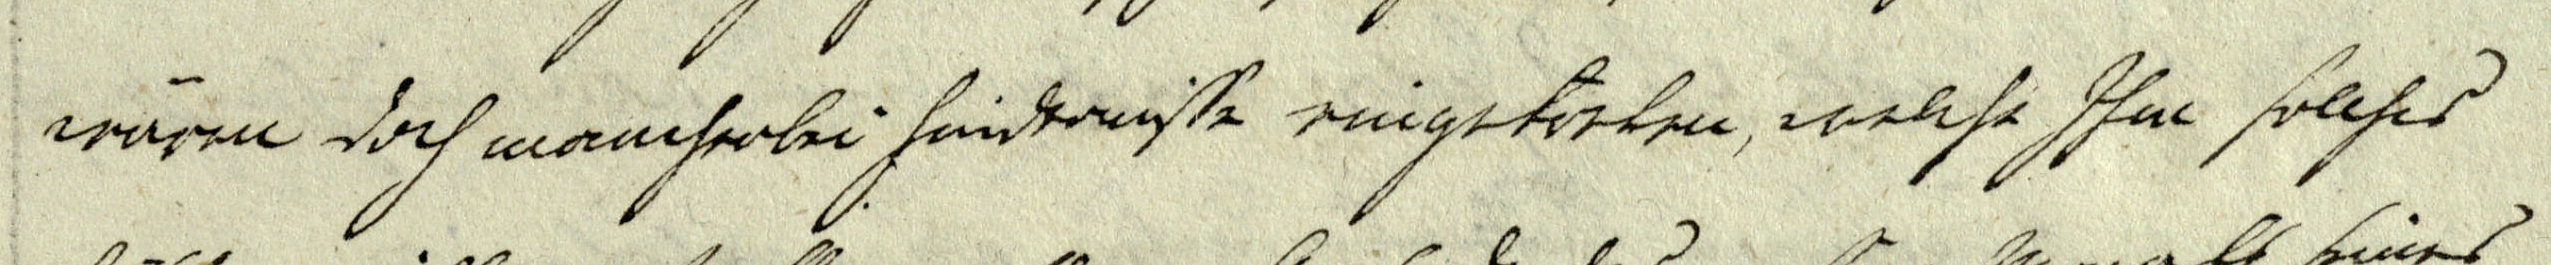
wären doch mancherlei Hindernisse eingetreten, welche Ihm solches
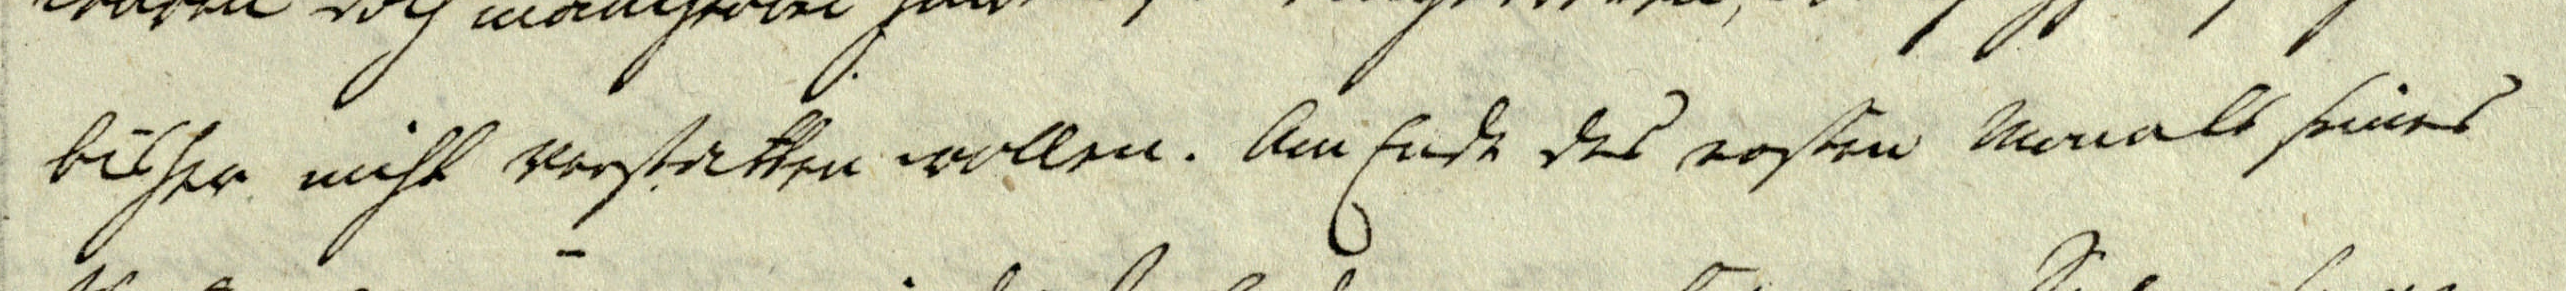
bisher nicht verstatten wollen. Am Ende des ersten Monats seines
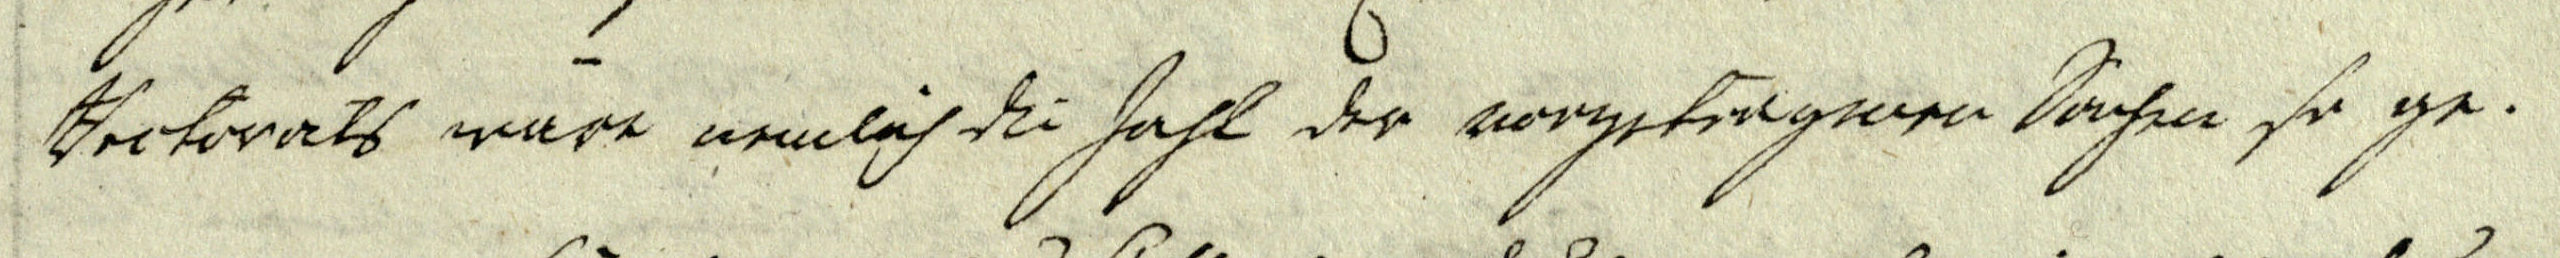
Rectorats wäre nemlich die Zahl der vorgetragenen Sachen so ge¬
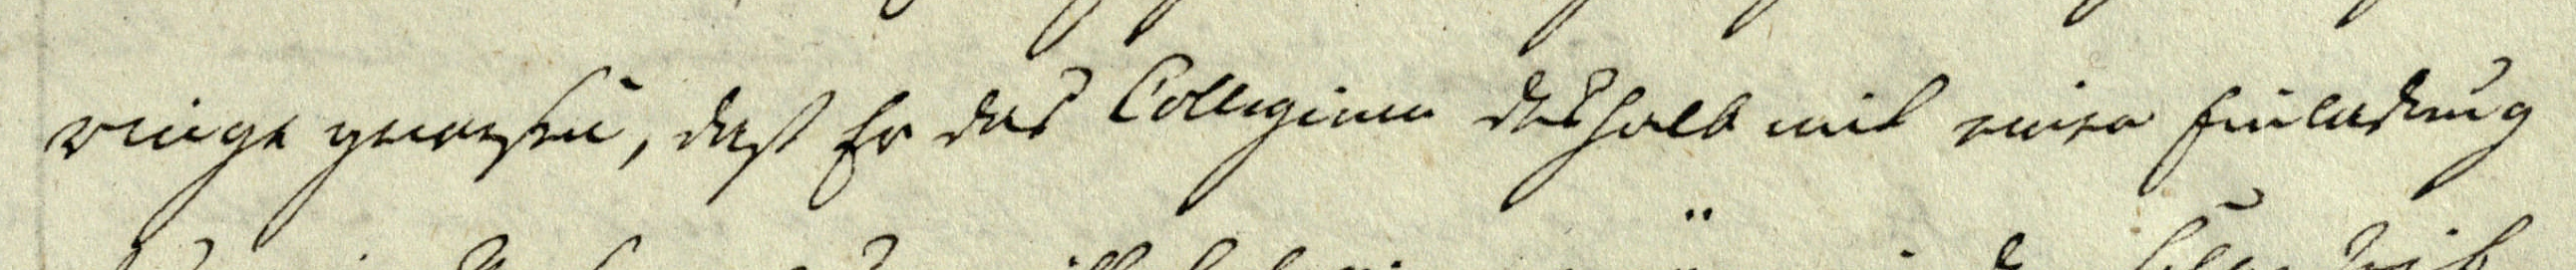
ringe gewesen, daß Er das Collegium deshalb mit einer Einladung
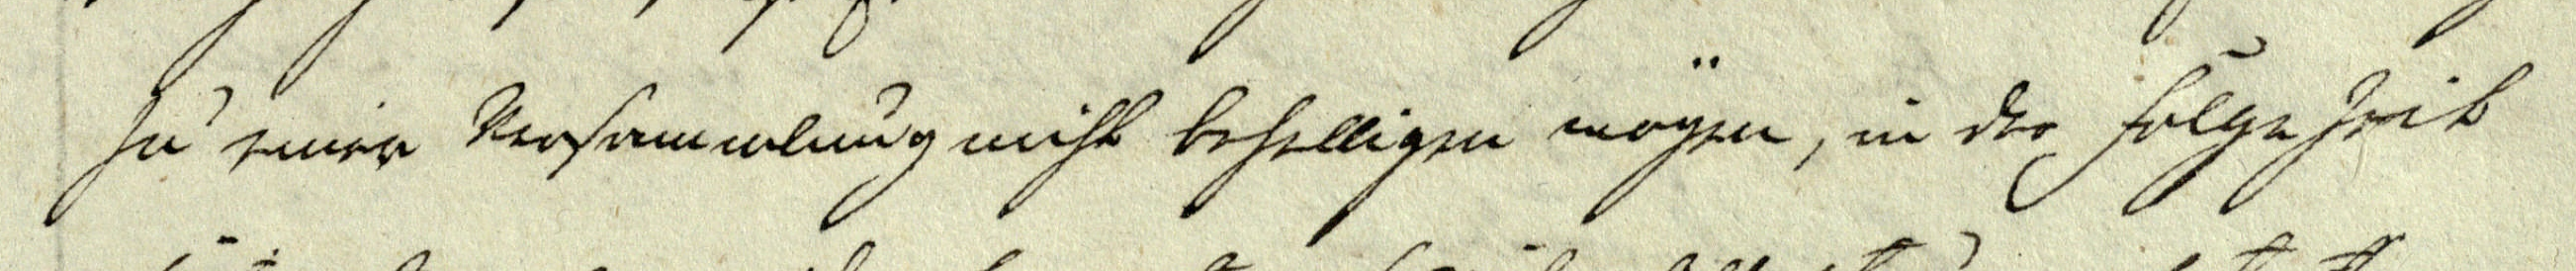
zu einer Versammlung nicht behelligen mögen, in der Folgezeit
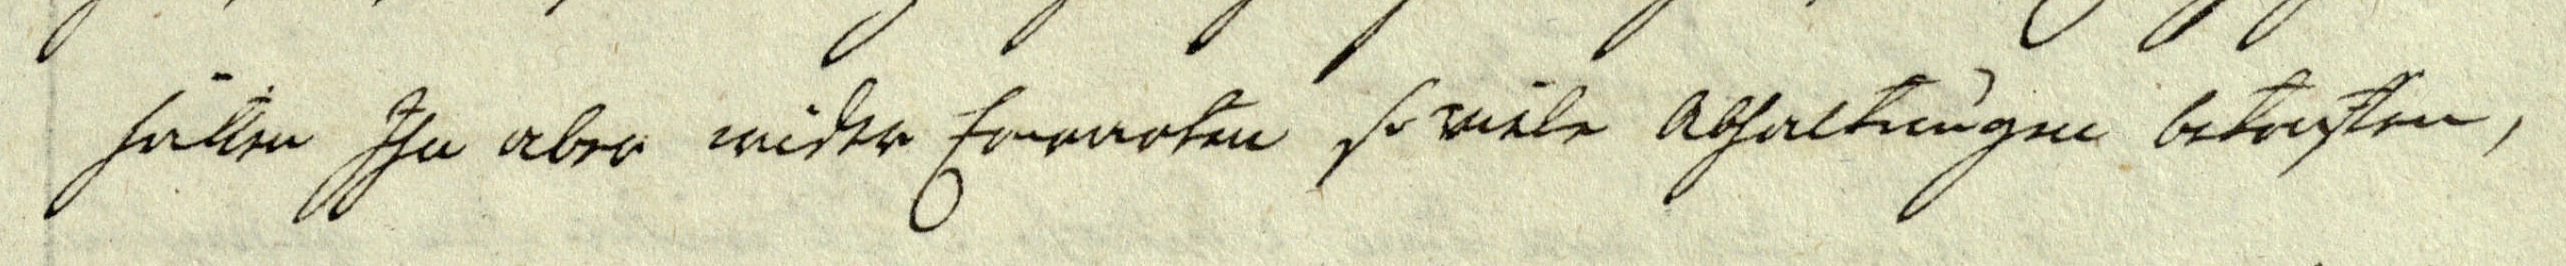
halten Ihn aber wider Erwarten so viele Abhaltungen betroffen,
